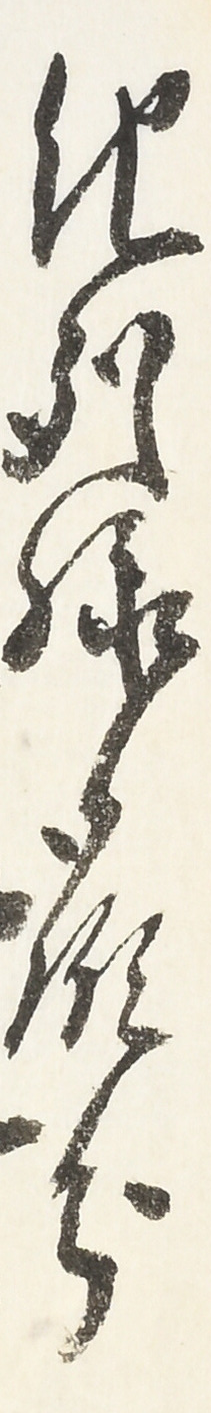佐州様御領分
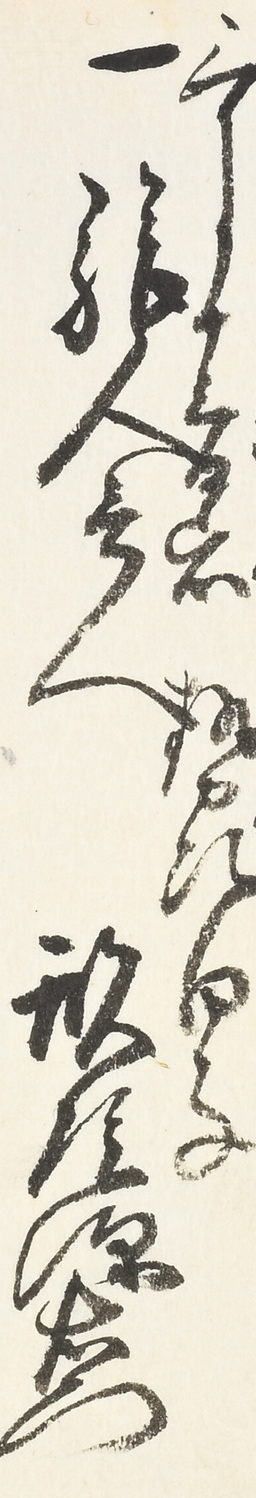一旅人壱人形屋源右衛門
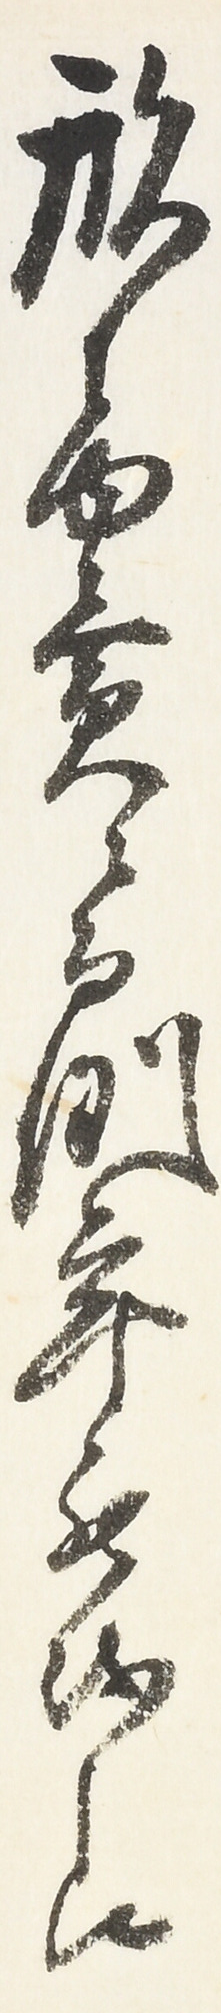形商売ニ而例年罷越申候
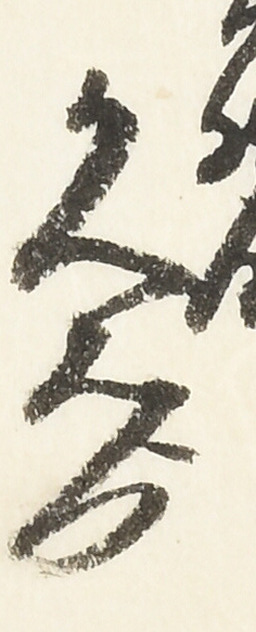久右衛門
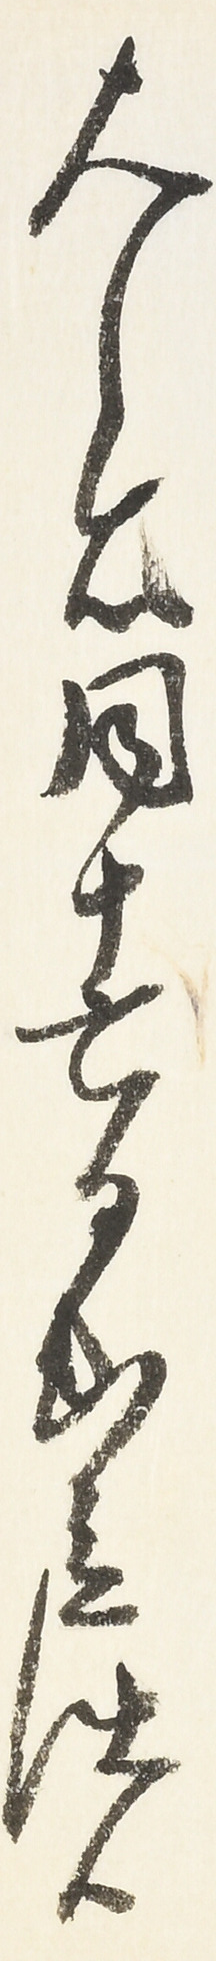右之者同十六日出立仕候
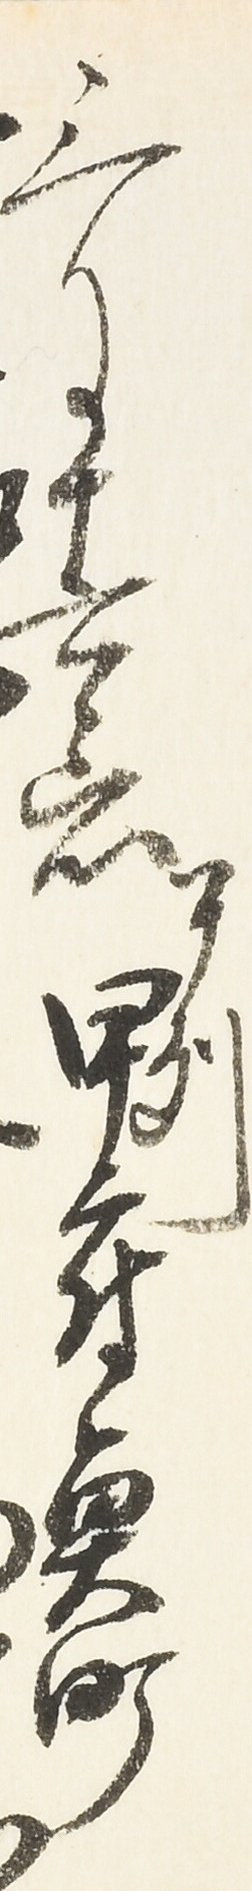三月十六日着甲府奥町
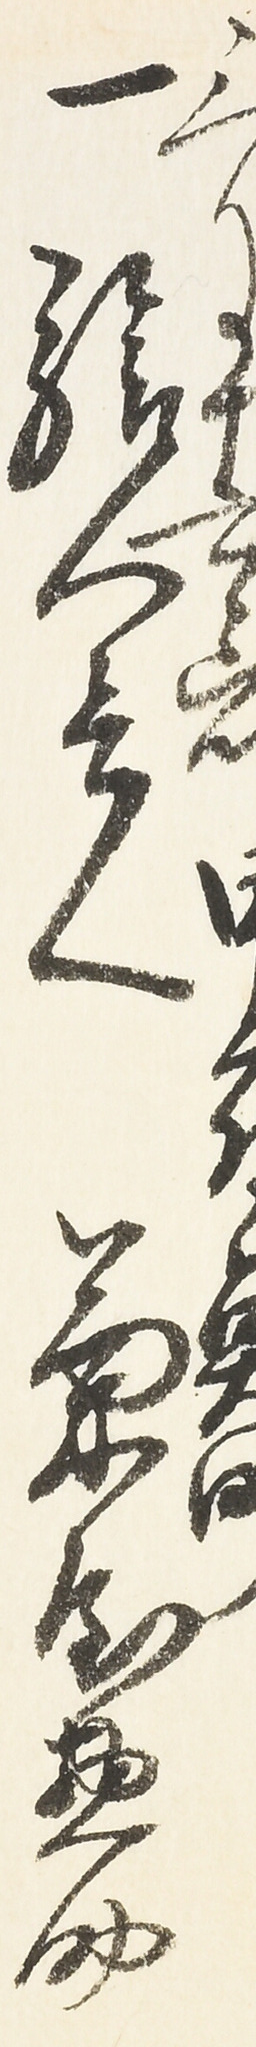一旅人壱人兼屋惣助
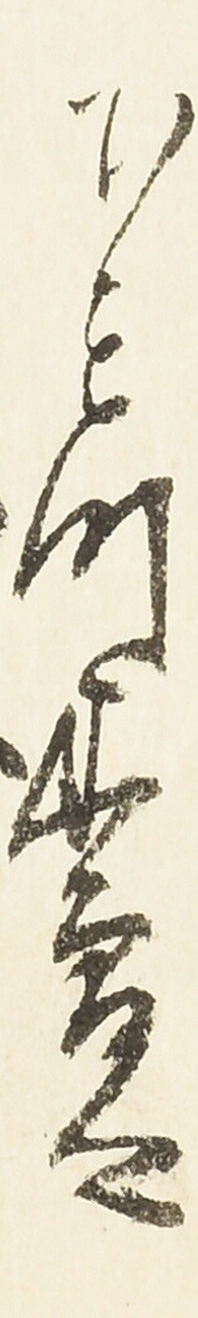下モ町木曽や
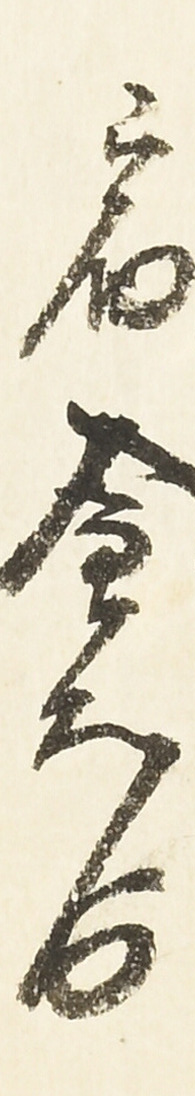宿金右衛門
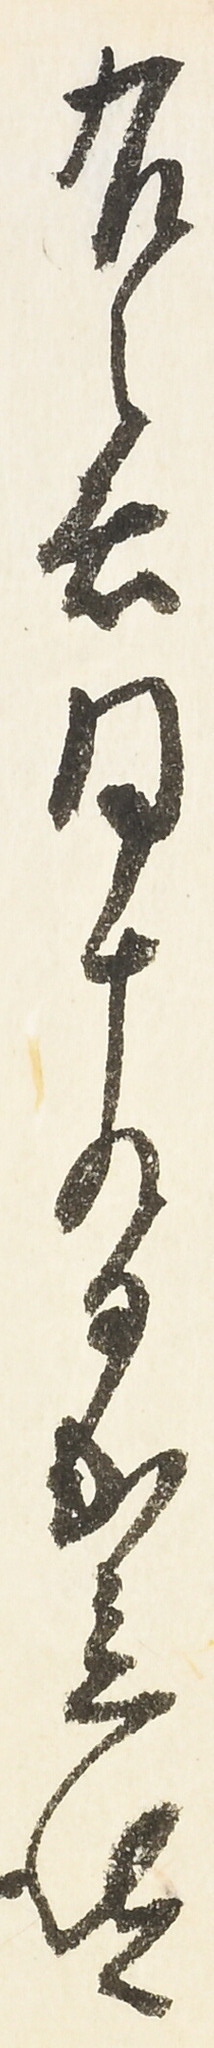右之者同十九日出立仕候
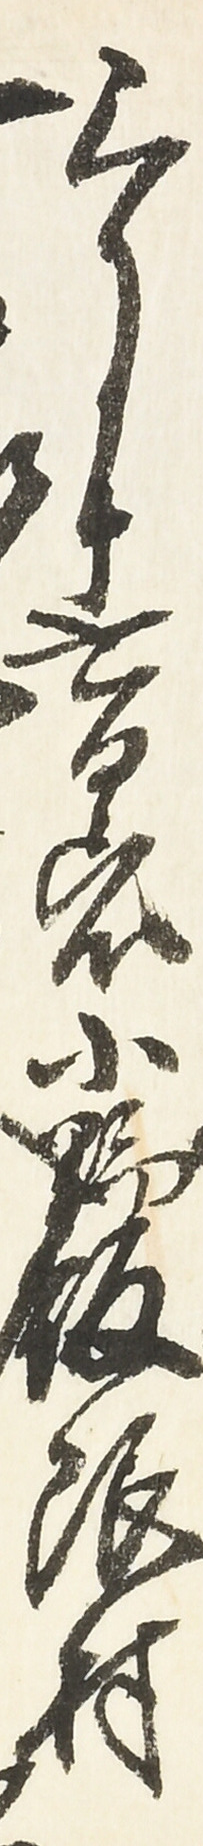三月十六日着小野飯限村
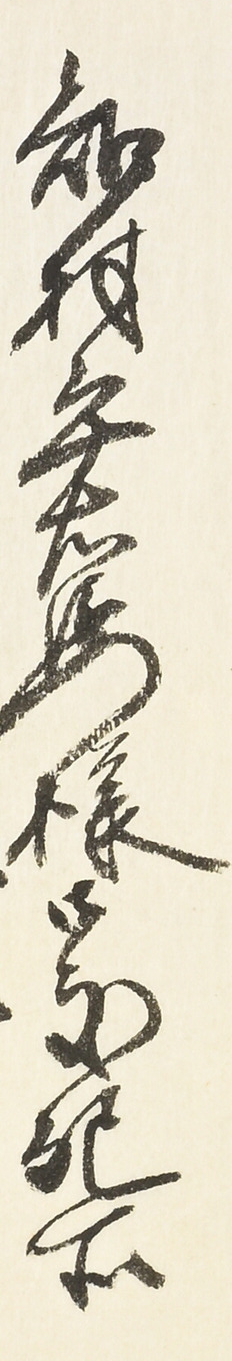知村平右衛門様御支配所
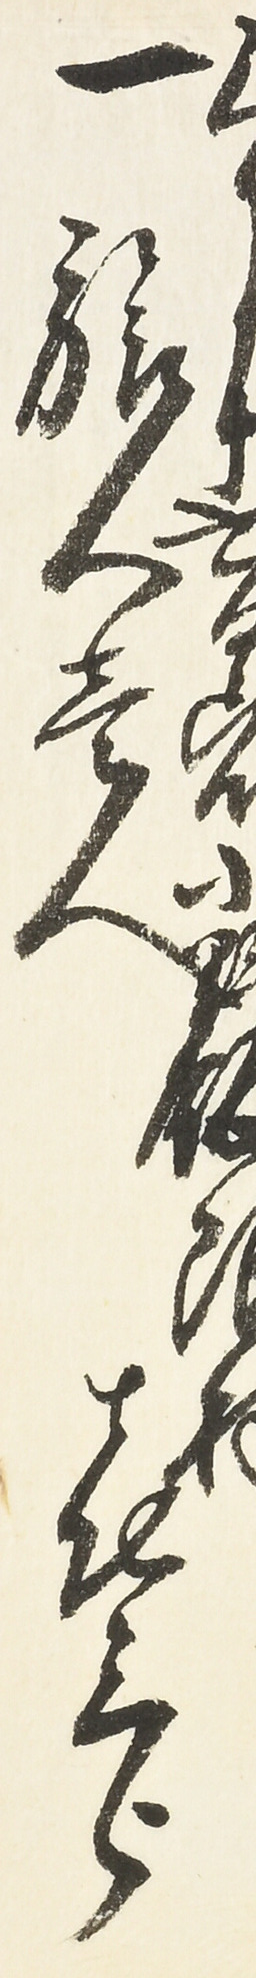一旅人壱人喜三郎
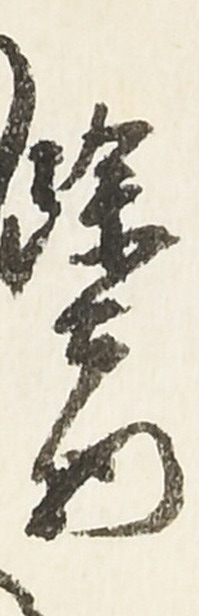久右衛門
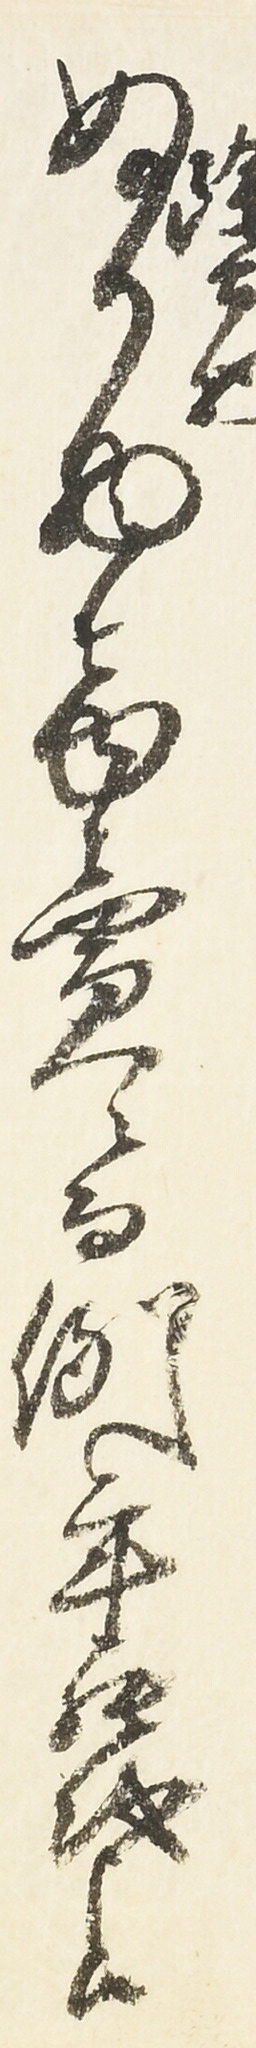ぬり物商売ニ而例年罷越申候
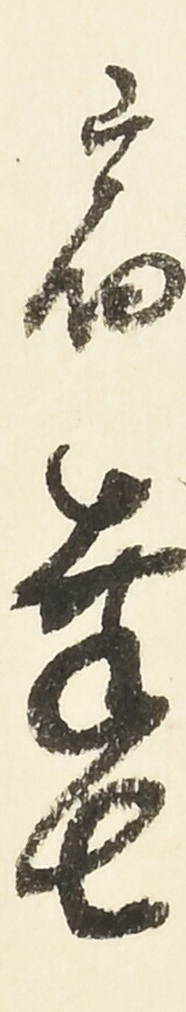宿幸七
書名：町中旅人泊控帳
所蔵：伊那市立高遠町図書館・合同会社AMANE
